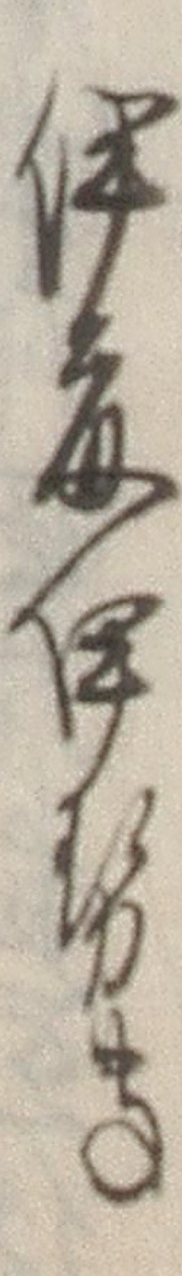伊藤伊勢守
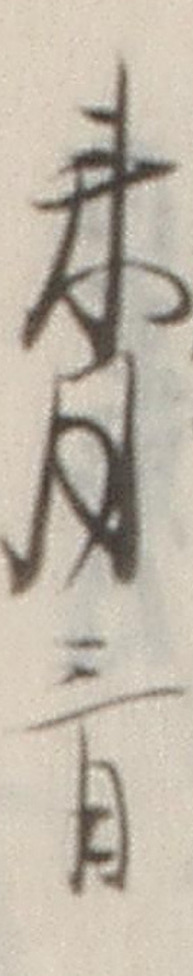来月三日
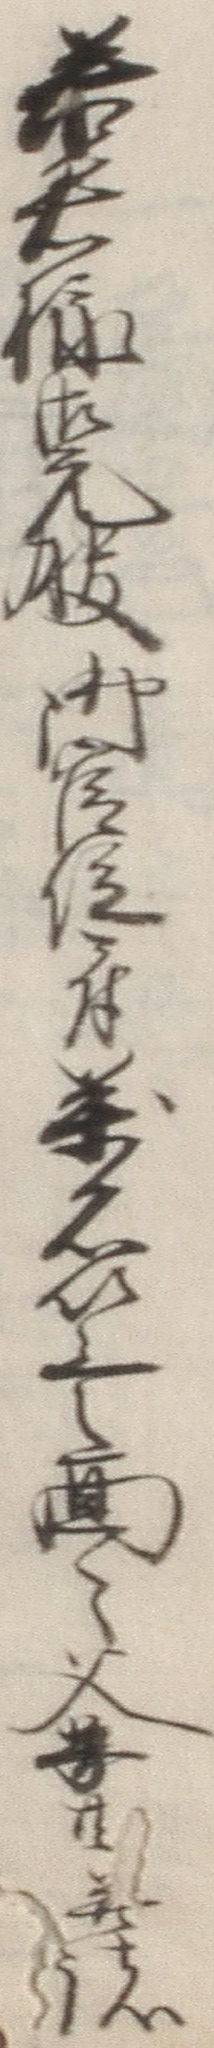若君様御元服御官位ニ付万石以上の面々父子共并諸
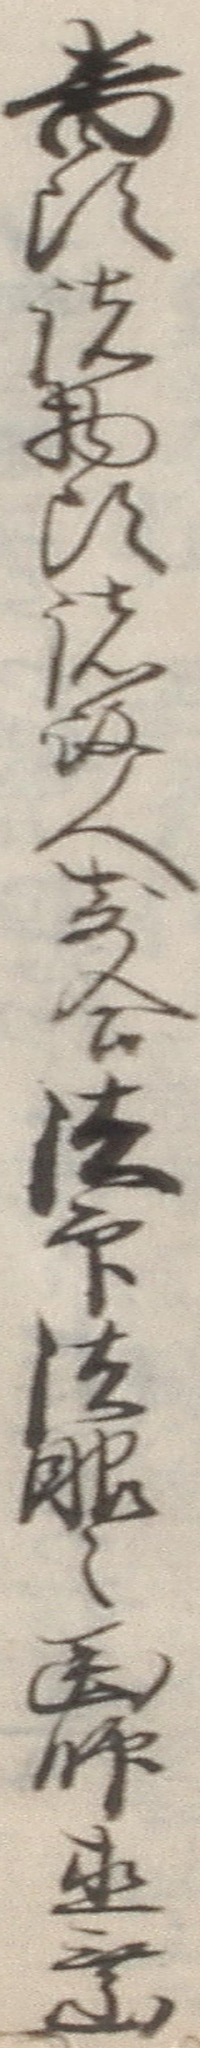番頭諸物頭諸役人寄合法印法服の医師直垂
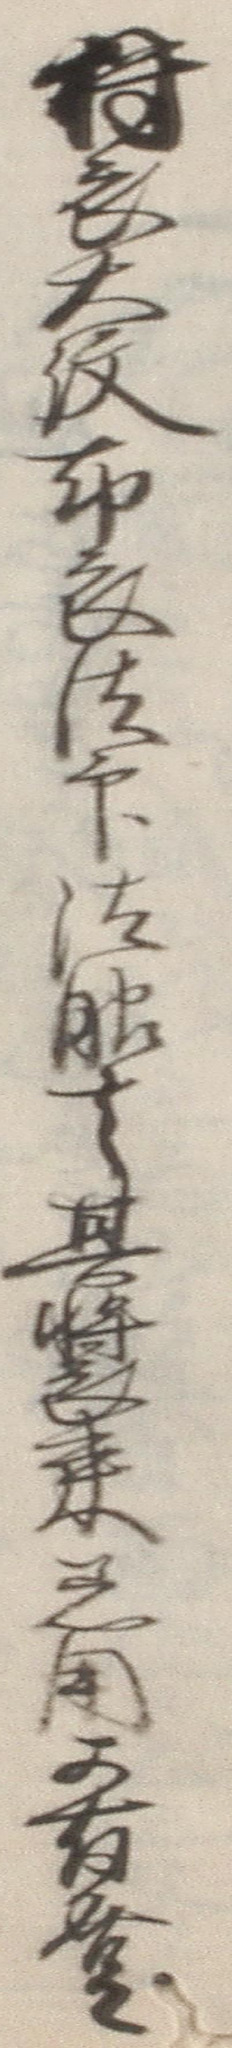狩衣大紋布衣法印法服は其装束着用可有登
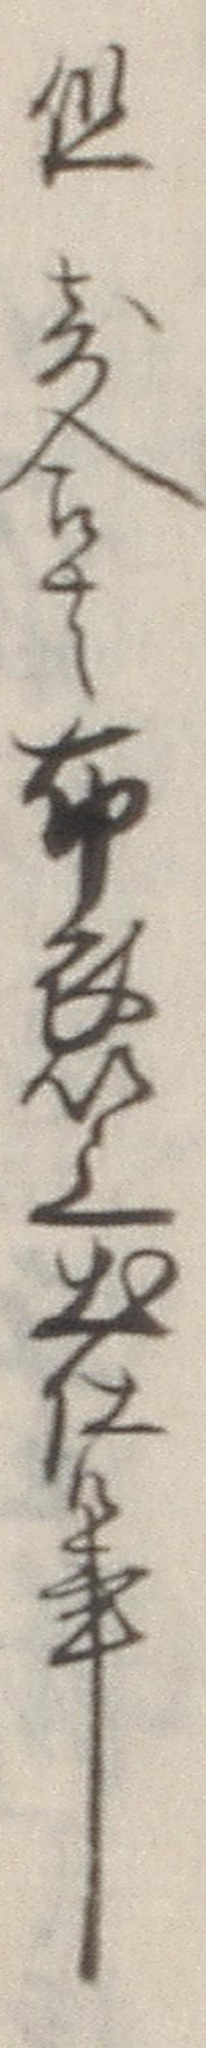但寄合は布衣以上出仕候事
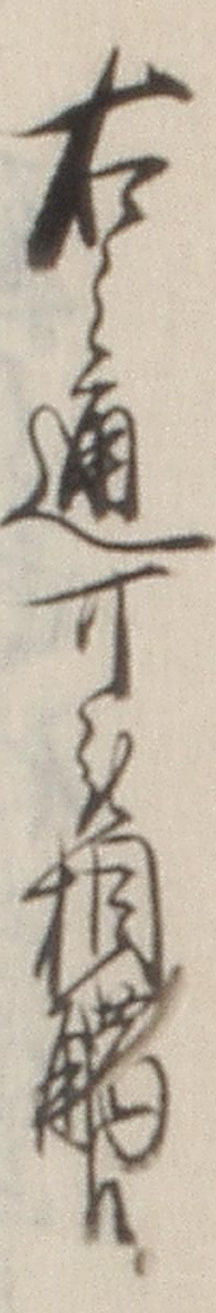右の通可被相触候
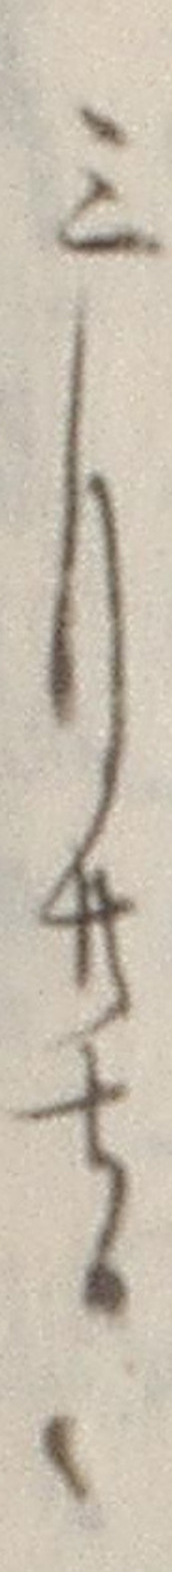三月廿七日
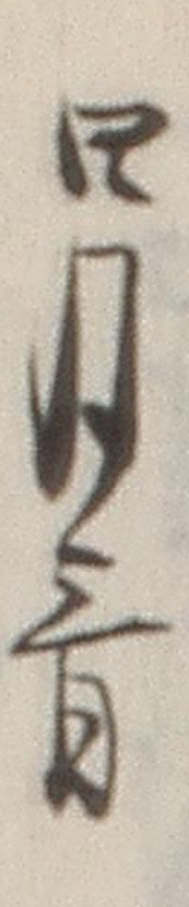四月三日
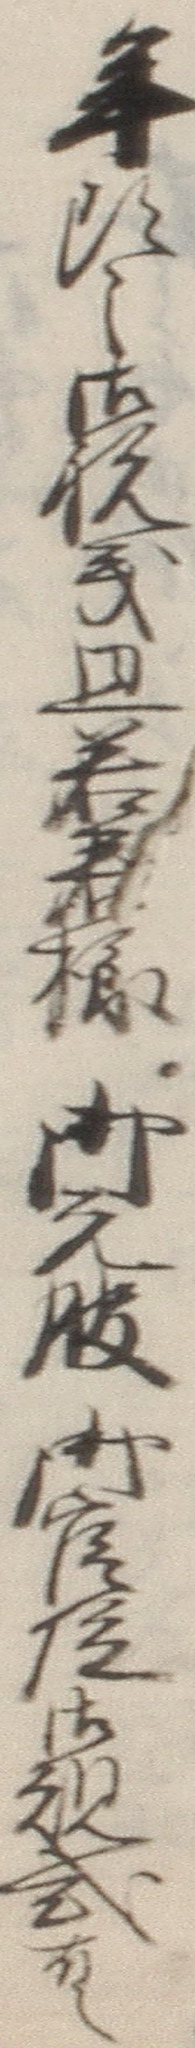年頭の御祝義且若君様御元服御官位御規式有之
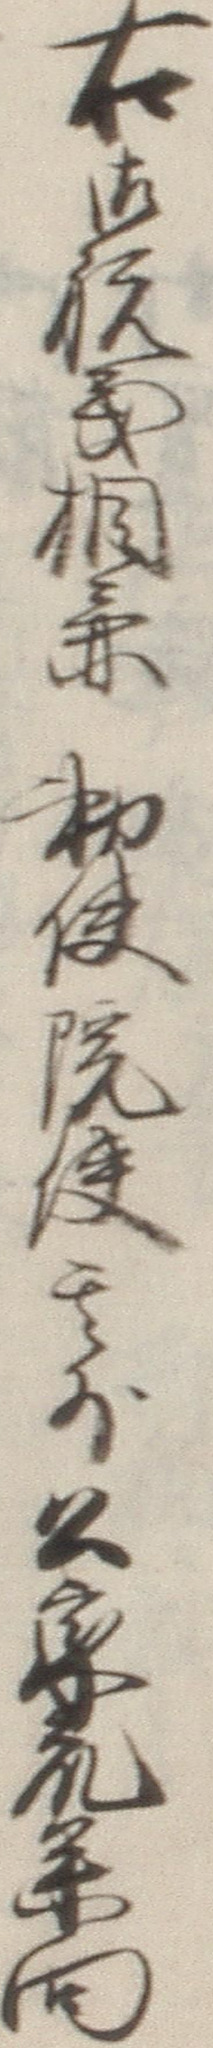右御祝義相兼初使院使其外公家衆参向
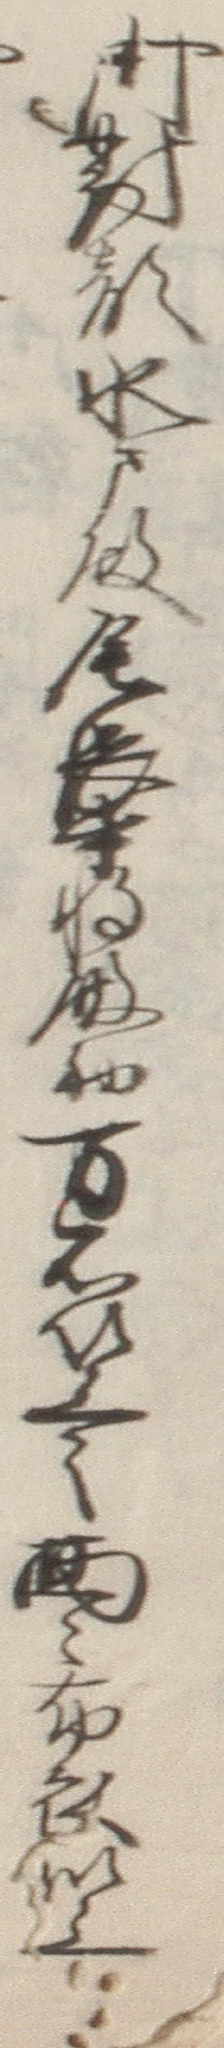御対顔水戸殿尾張中将殿初万石以上の面々布衣以上
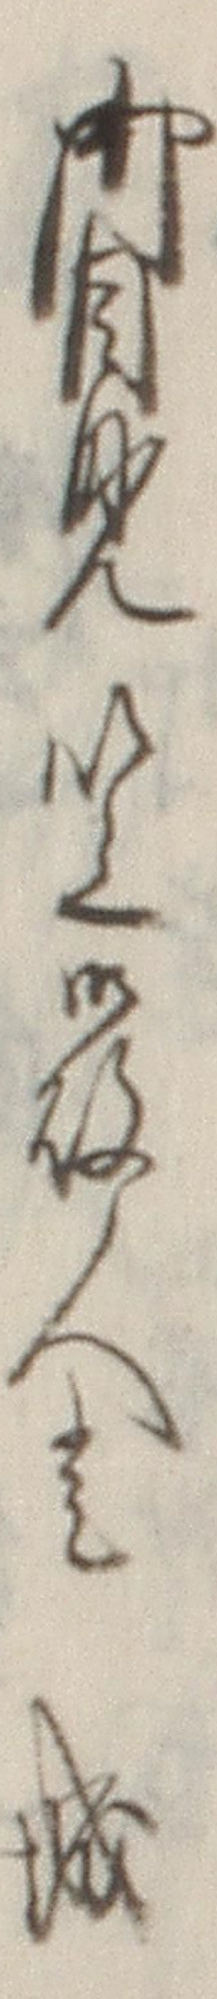御目見以上御役人登城
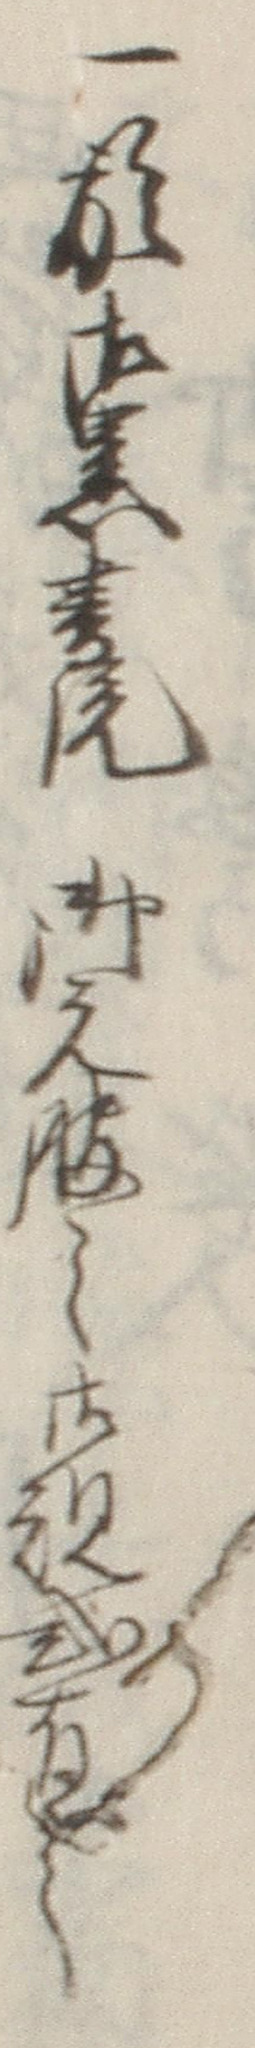一於御黒書院御元服の御規式有之
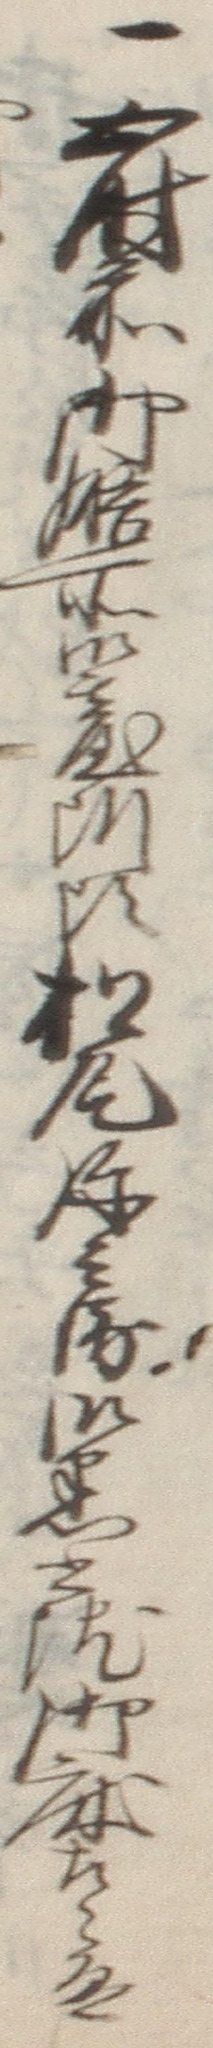一五時前御膳所御台所頭松尾弥兵衛御黒書院御床左の通
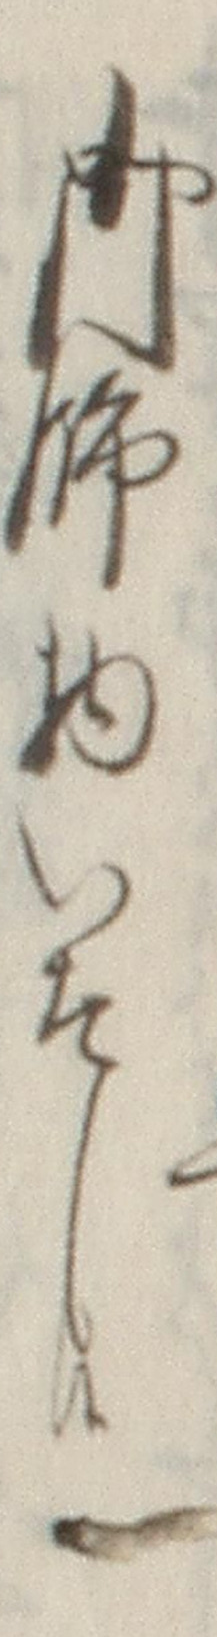御飾物いたし候
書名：[諸国災害記録]
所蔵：東京大学地震研究所図書室 Earthquake Research Institute Library, The University of Tokyo, JAPAN
